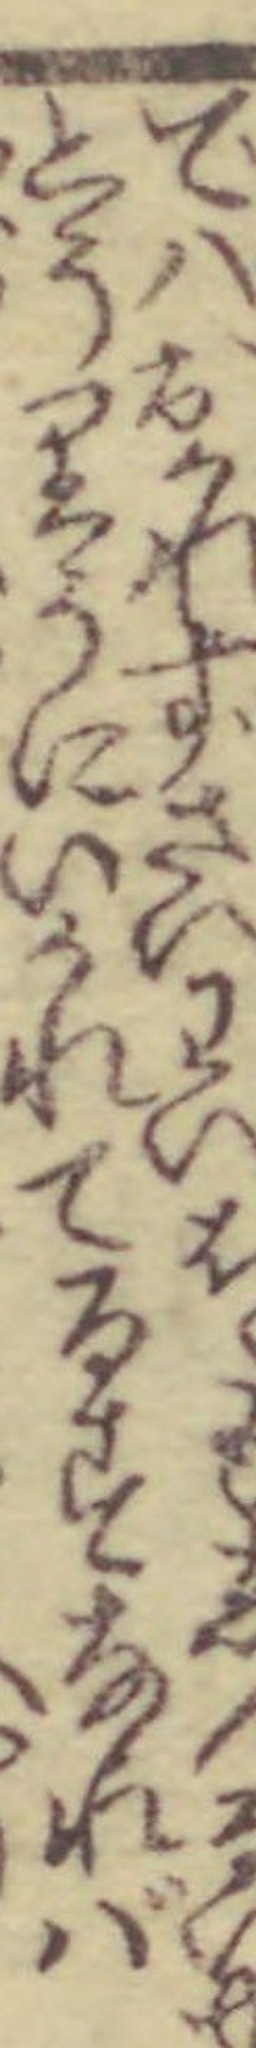とうりうにいかれてるすなれば
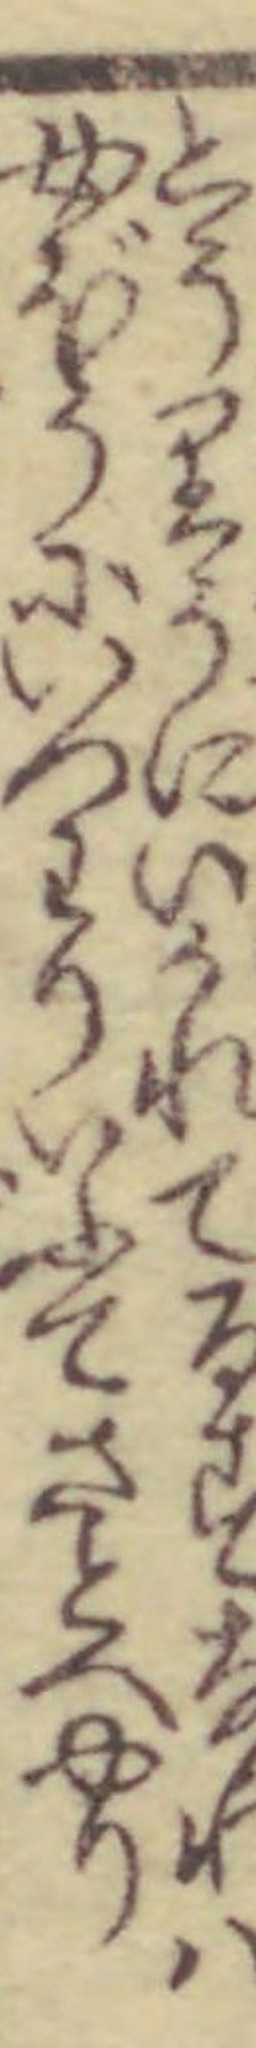女ぼうにいつわりいふてさとへやり
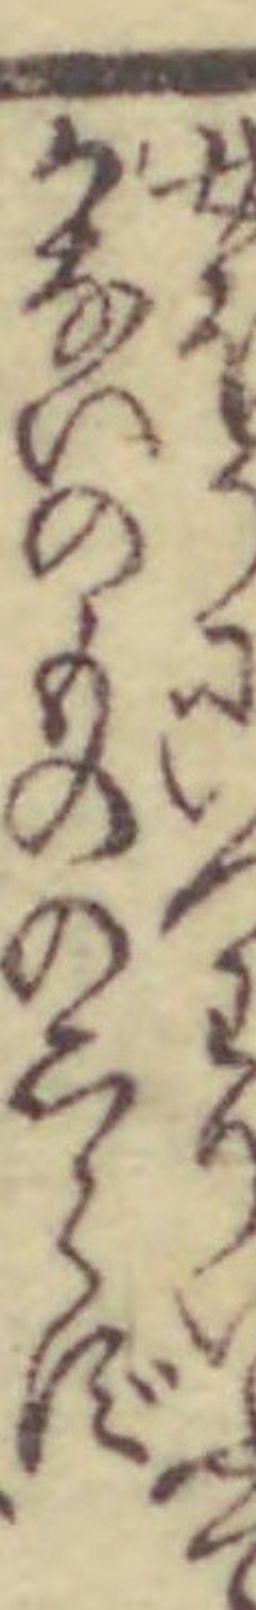かないのもののこらず
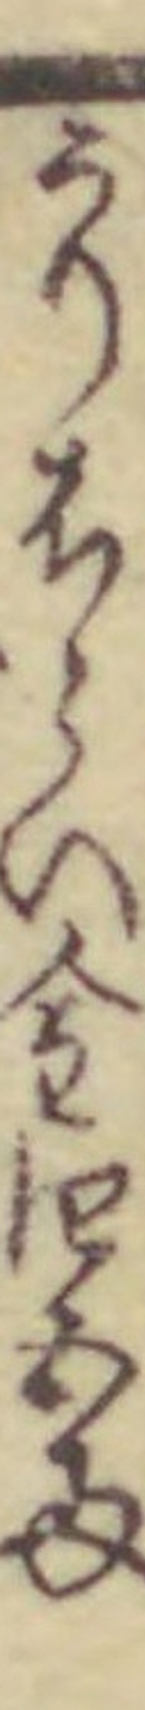うりはらい金四五両
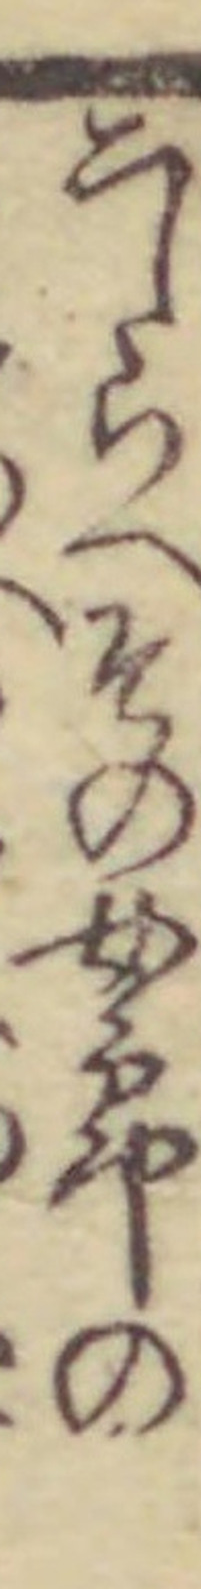こしらへその女郎の
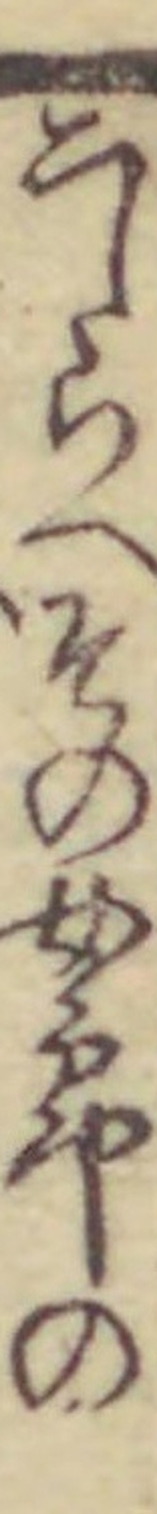こしらへその女郎の
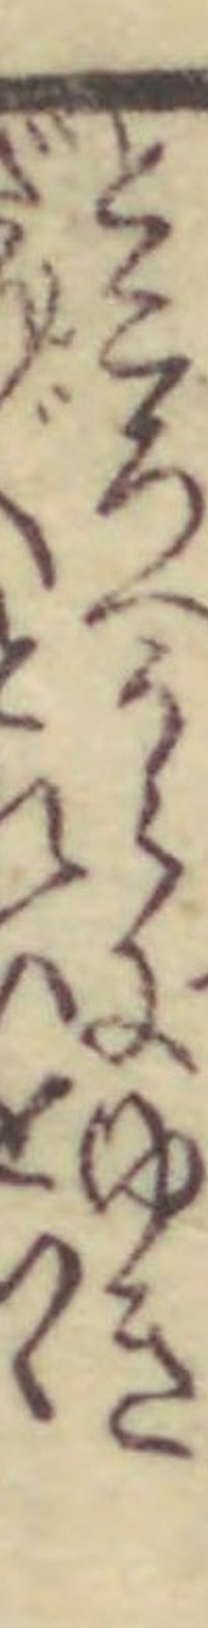だん〴〵とれいをいゝ
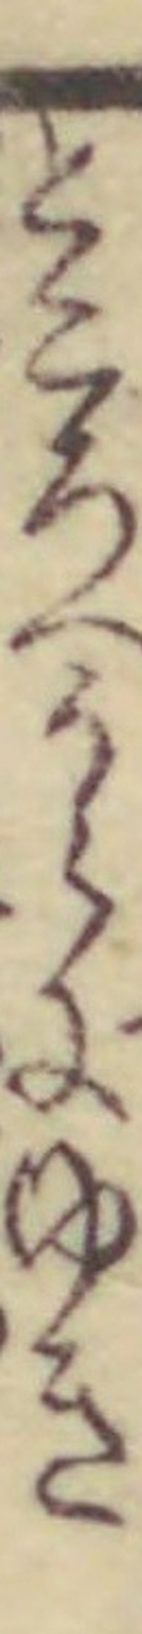ところへうらにゆき
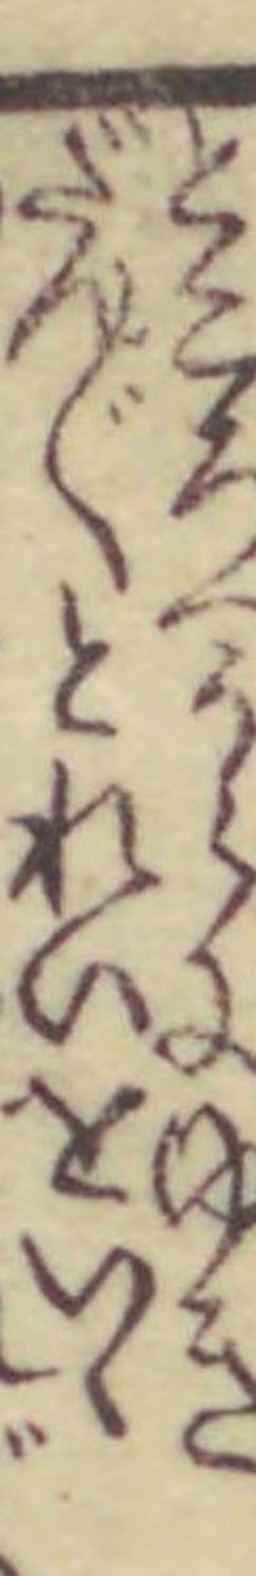だん〴〵とれいをいゝ
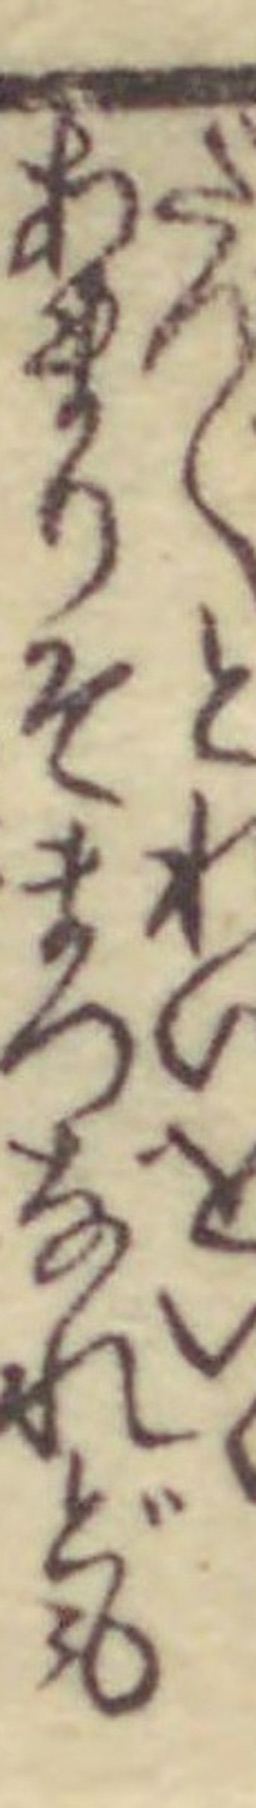あまりそまつなれども
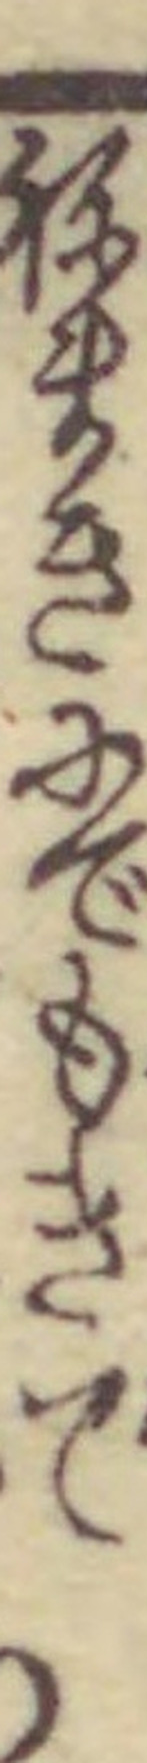ねまきにでもきて
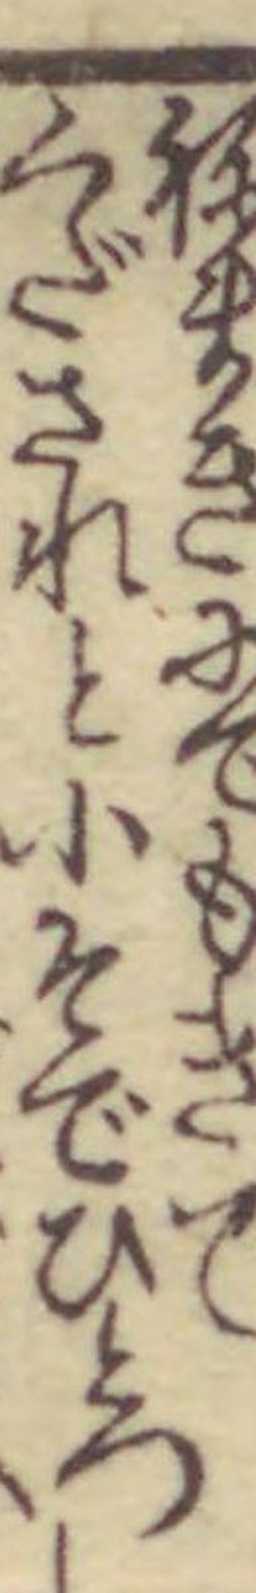くだされと小そでひとつ
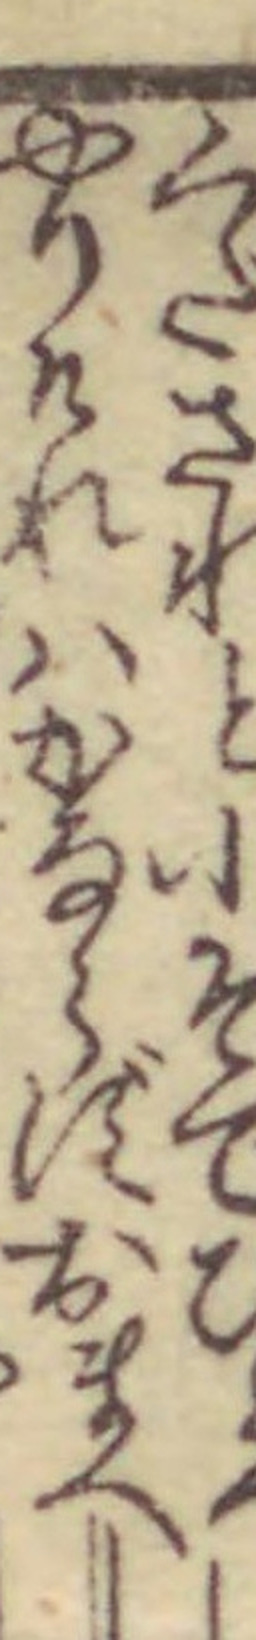やりけれはかならずおまへ
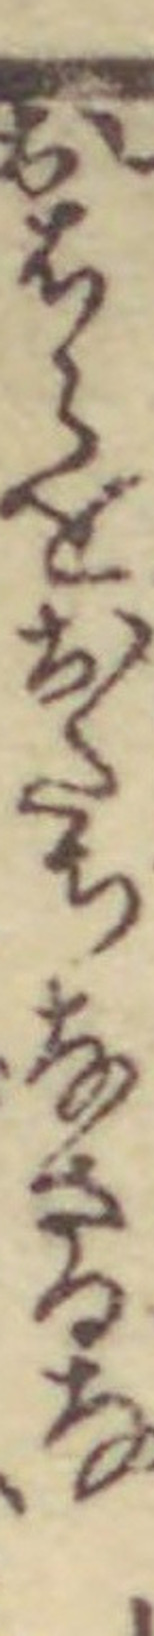おはらをおたちなさるな
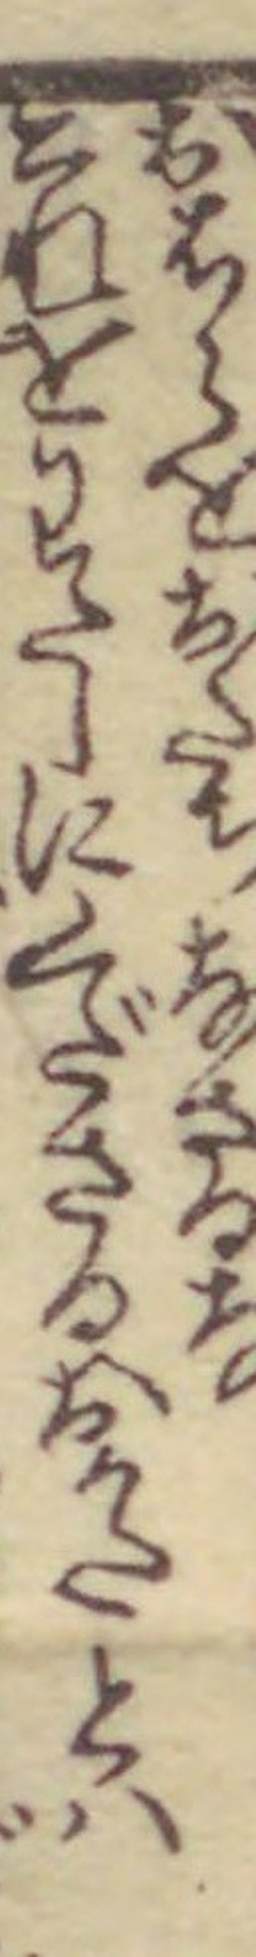これをわたしにくださるおかたとは
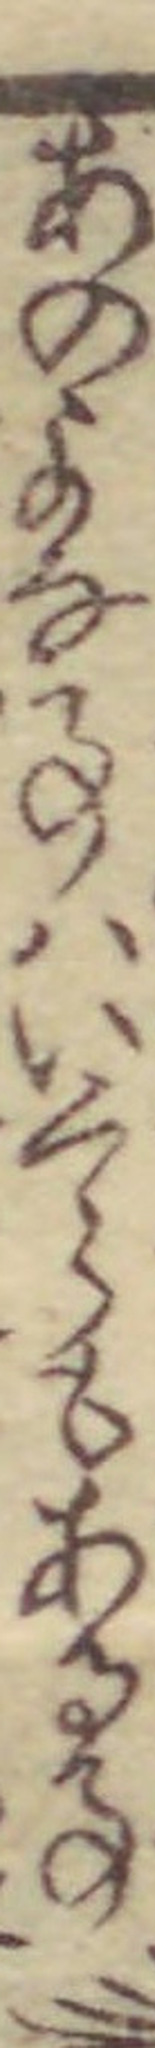あのよな事はいくらもある事
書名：大通人穴[サガシ] 3巻
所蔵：国立国会図書館 National Diet Library, JAPAN
